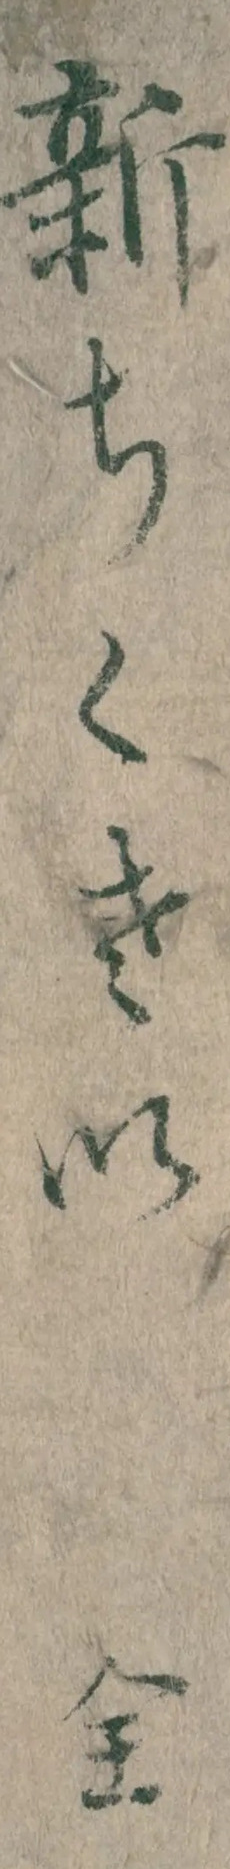新ちくさい全

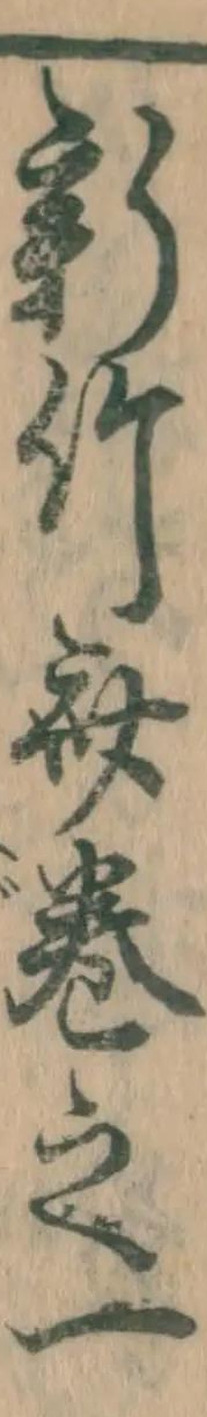新竹斎巻之一
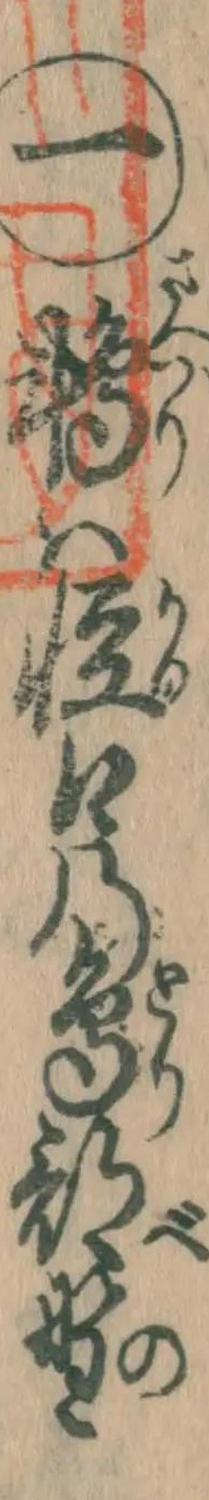一は軽口の島部野
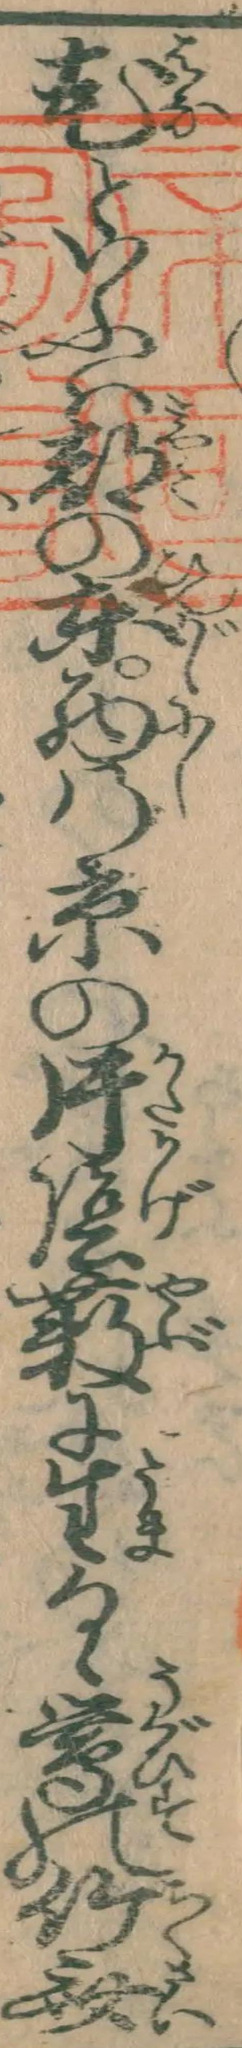花といふは都の東。西の京の片陰薮に生るゝ鴬の竹斎
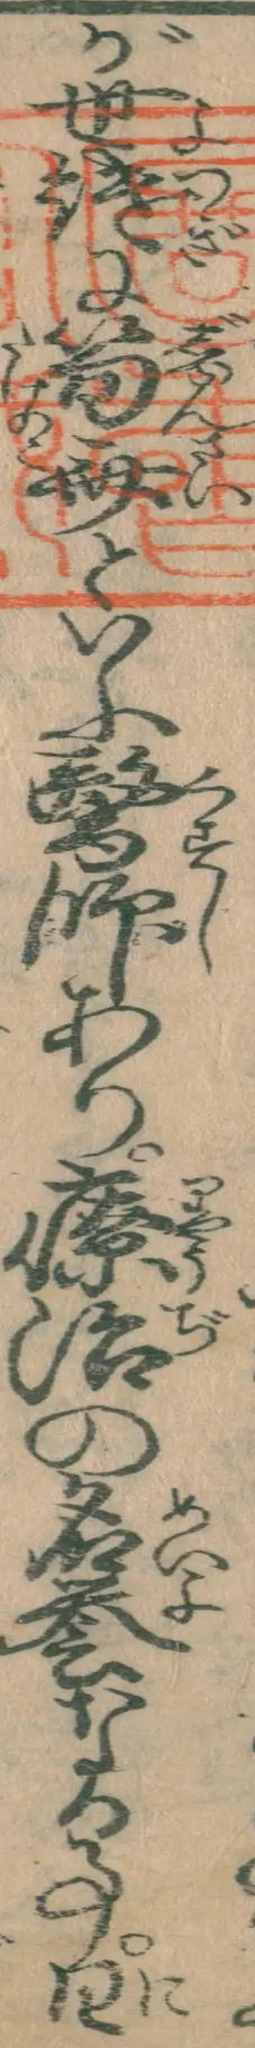が世継に筍斎といふ医師あり。療治の名誉なる事。日
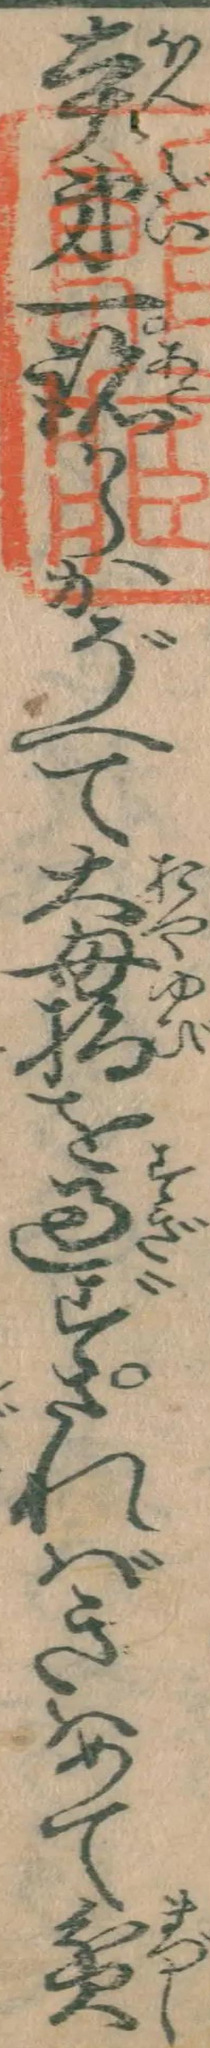本第一。跡からかぞへて大母指を過ず。さればきはめて貧
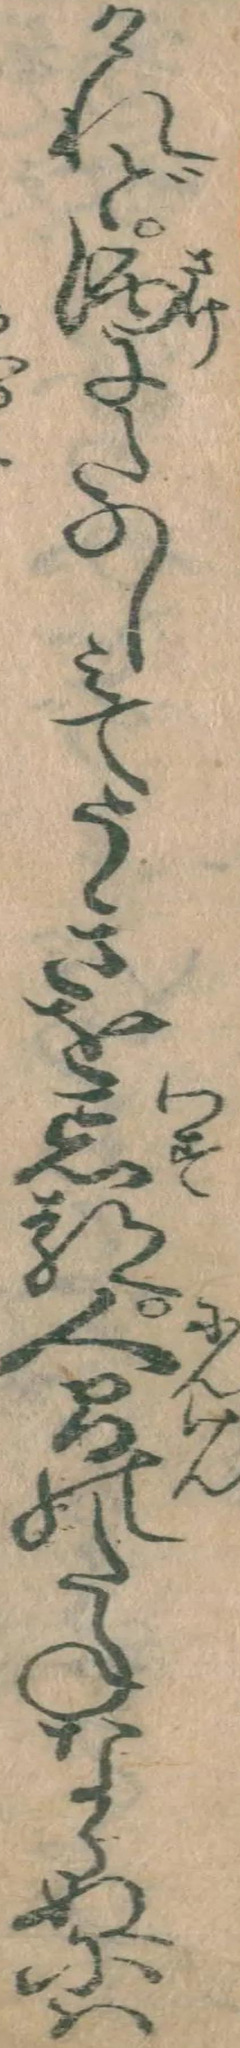けれど。酒にたのしみてうさを忘る。人間のたねならぬには
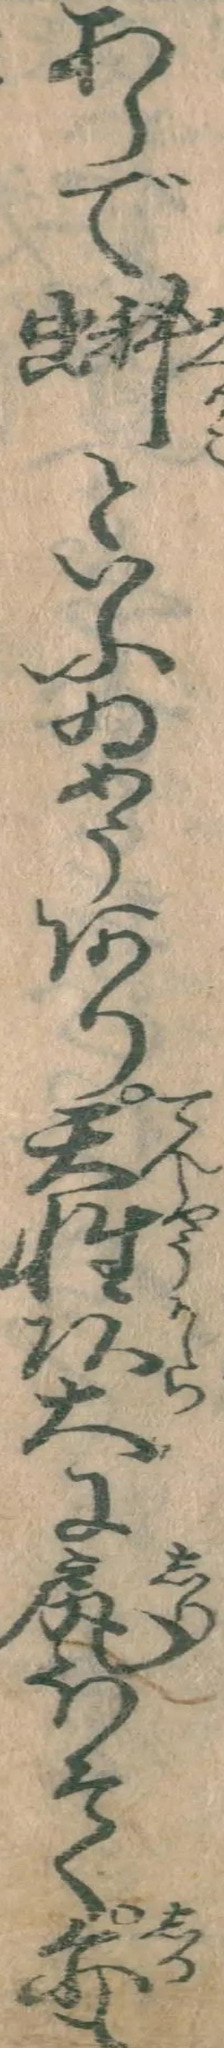あらで蝌といふゐめうあり。天性頭大に尻ほそく。爾も
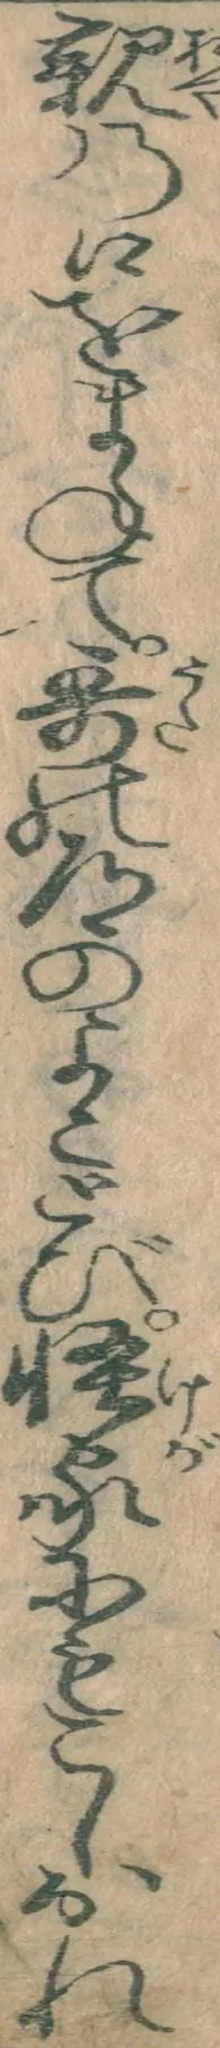親の口をまねて。歌の道のよことび。怪我にもこしおれ
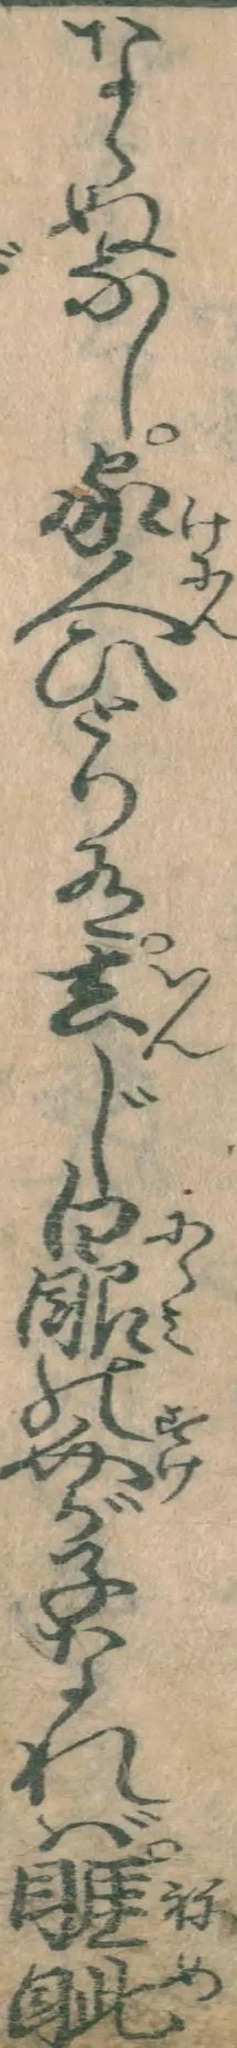ならぬなし。家人ひとり有。去じ白眼の介が子なれば。睚眦
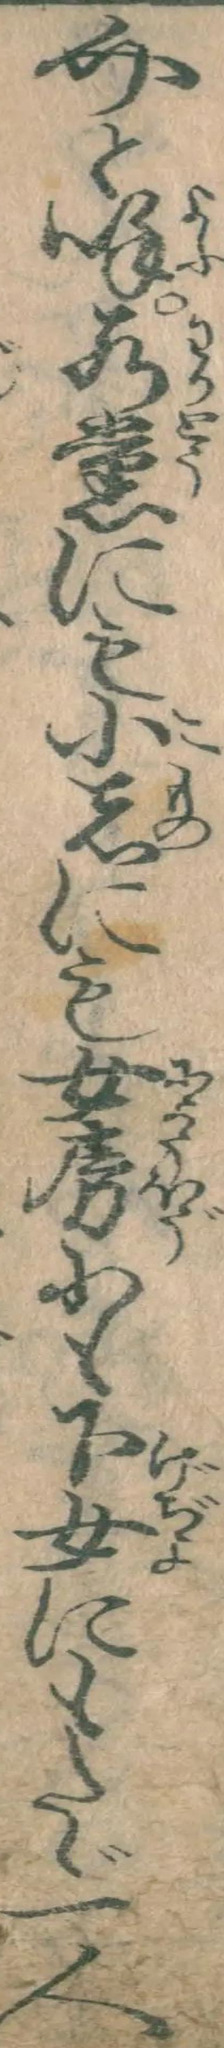介と呼。若党にも小者にも女房にも下女にもたゞ一人
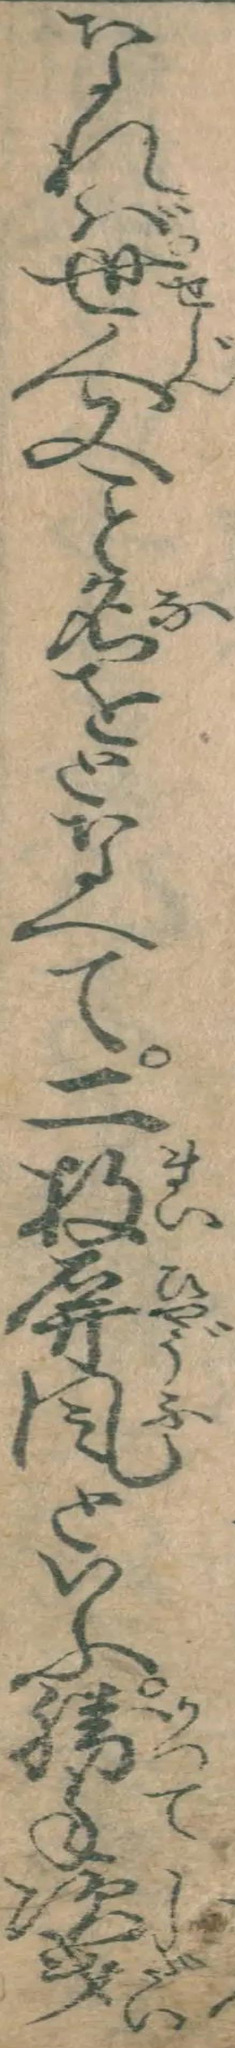なれば。世人又こと名をとなへて。二枚屏風といふ。勝手次第

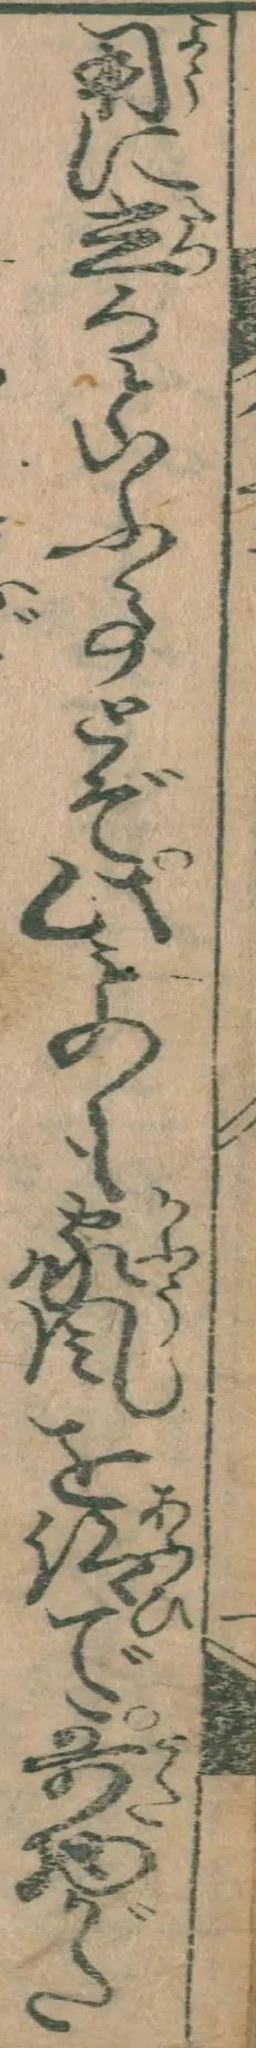用に立るといふ事とぞ。此ものも家風を仰で。歌物がた
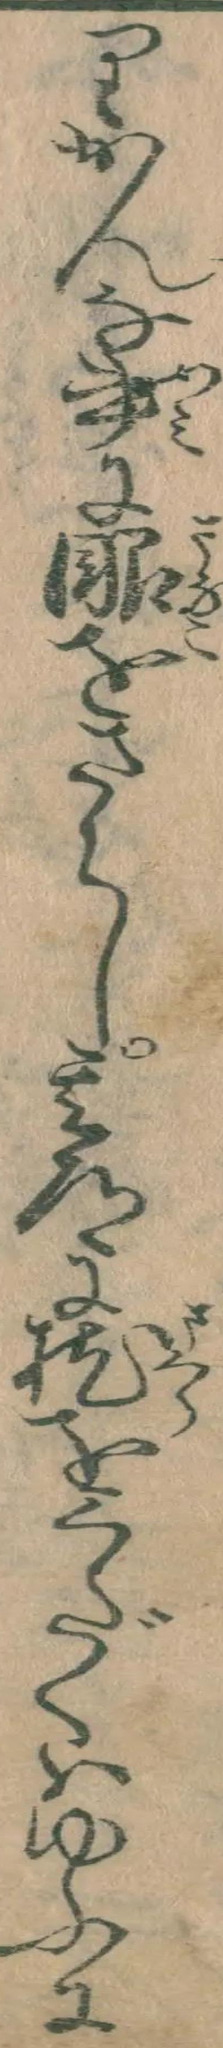りかんな書に眼をさらし。其道に枕をくだくはゆふに
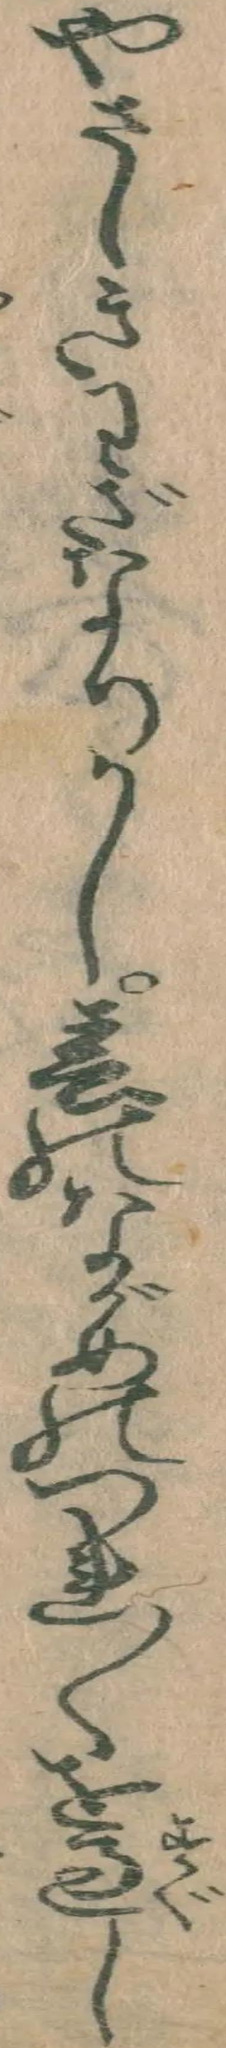やさしきわざなりかし。春のながめのつれ〳〵を過し
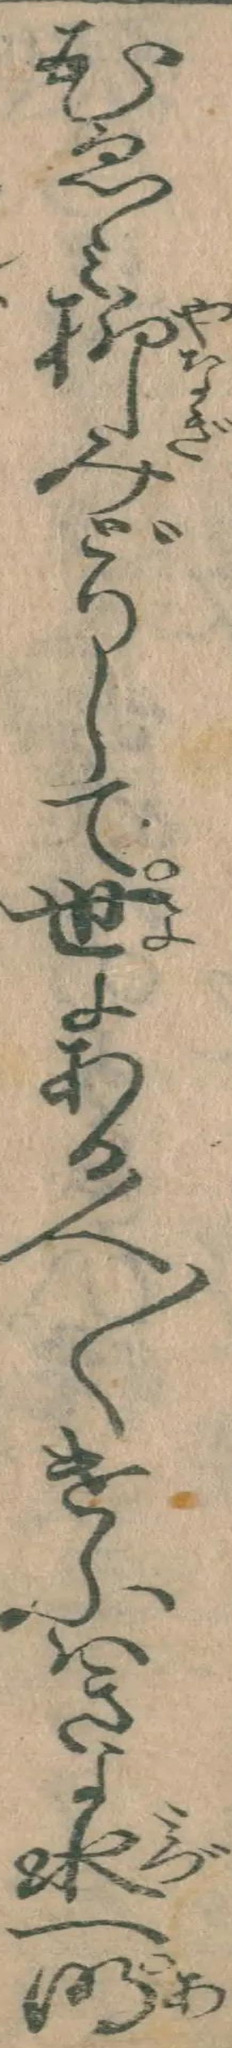花ゑみ柳みどりして。世にある人々けふはきよ水へ。明
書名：新竹斎 5巻
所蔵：国立国会図書館 National Diet Library, JAPAN
